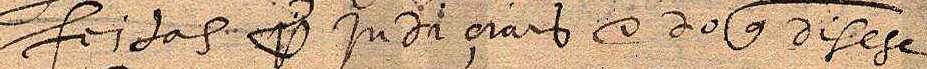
feitas p̄o judiçiaes e do q̄ disese
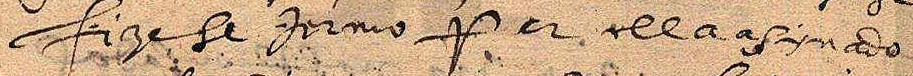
fizese termo per ella asynado
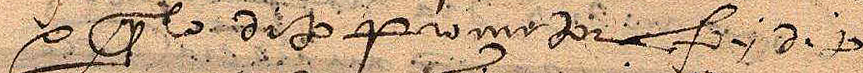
e p̄lo dito prometor foy dito
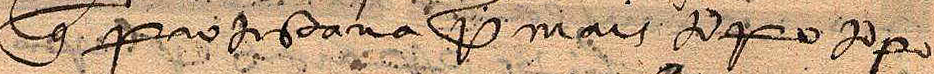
q̄ protestaua p̄o mais tēpo tēpo
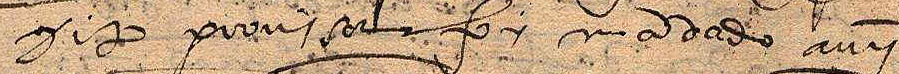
dito prouisor foy mādado a mj̄
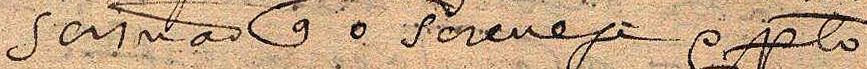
scriuão q̄ o screuese e p̄lo
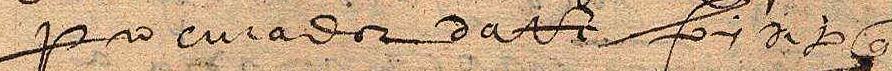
procurador da Re foy dito q̄
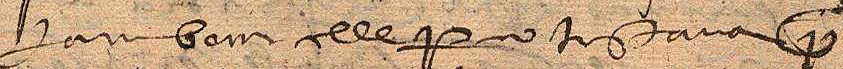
tambem elle protestaua p̄o
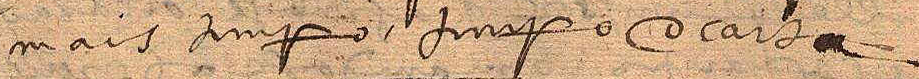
mais tempo / tempo e carta
